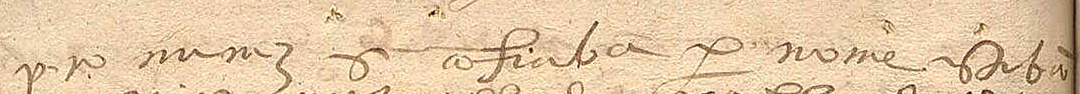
pero nunez se c̄ofiava ꝑ nome estevão
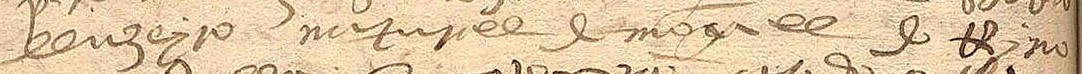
lluzejro naturall de moguell do Rejno
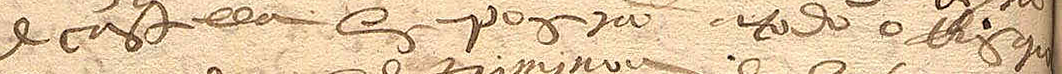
de castella e se poseraõ a todo o Risquo
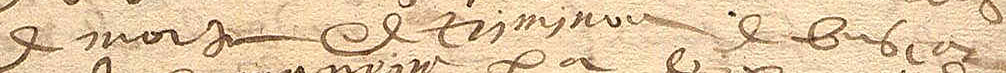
de morte e detriminou de buscar
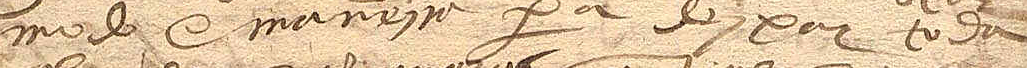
modo e manejra ꝑa dejxar toda
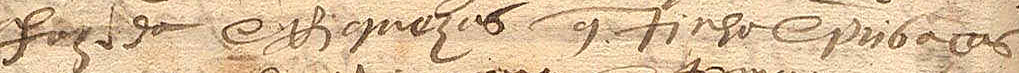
a fazēda e Riquezas q̄ tinha ē privaças
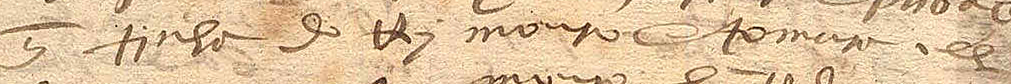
q̄ tinha do Rej mouro e tomara elle
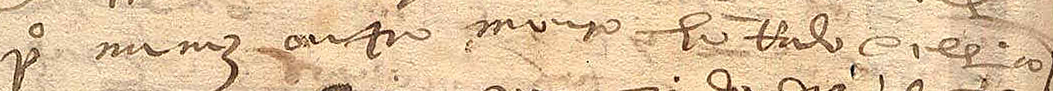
po nunez outro mouro hōRado e elle cō
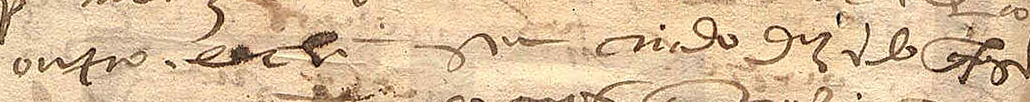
outro ellche seu criado dizēdo q̄ fosē
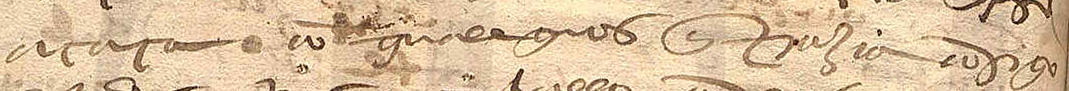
a caça c̄o guallguos q̄ trazia c̄osigo
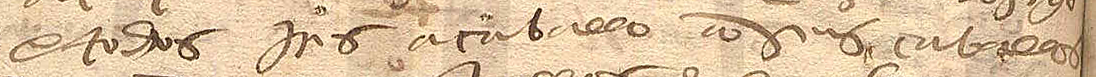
e todos tres a cavallo c̄o seus cavallos
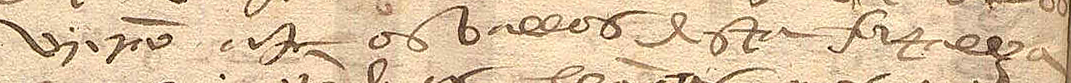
vierão ate os vallos desta fortalleza
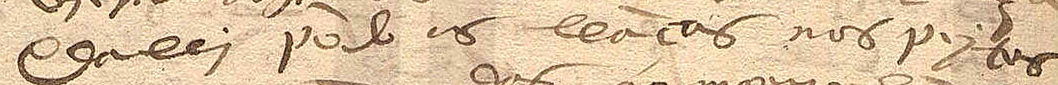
e dallj pōdo as llāças nos pejtos
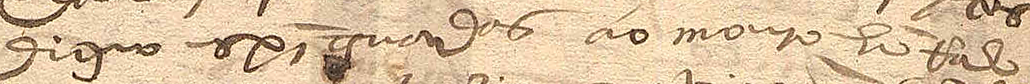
diguo espīguardas ao mouro hōRado
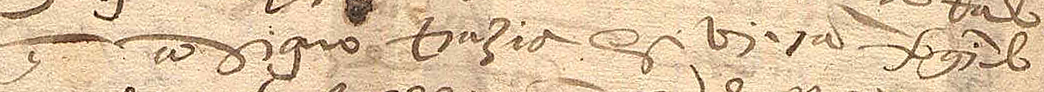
q̄ c̄osiguo trazia e se vierā fogīdo
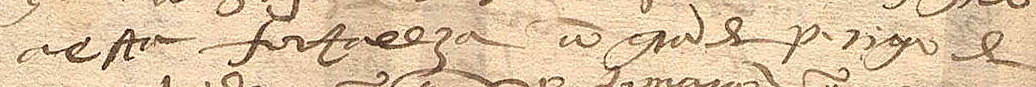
a esta fortalleza c̄o grāde perigo de
